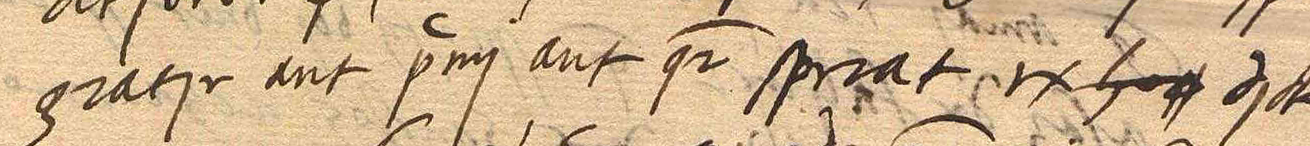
gratjr aut p̄mj aut q̄r sperat ex hoc djcto
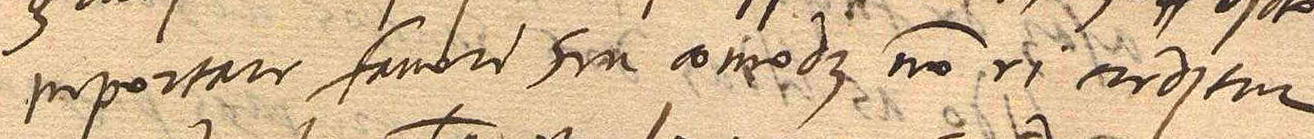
reportare fauorē seu comodꝫ n̄o ei credjtur
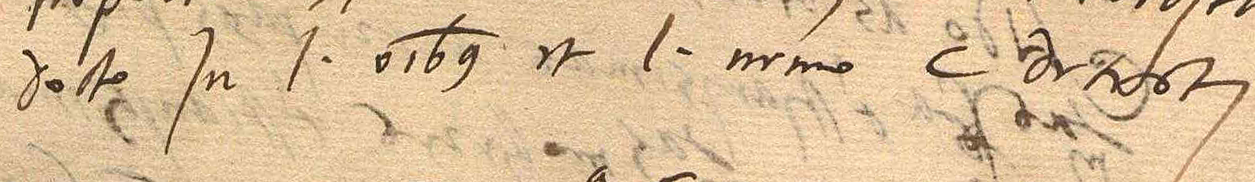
docto Jn l. oībꝯ et l. nemo C de testj
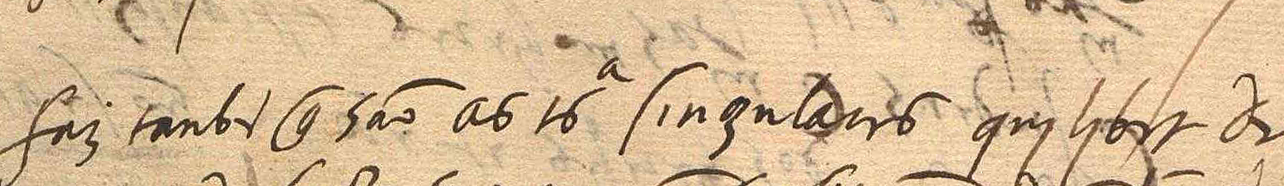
faz tanbē q̄ são as tsa singulares quj ljbet de
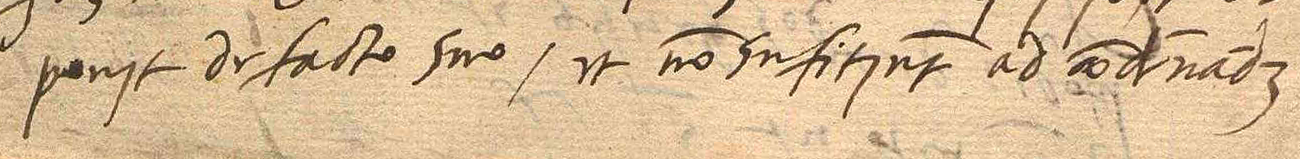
ponjt de facto suo / et n̄o sufitjēt ad c̄odenādꝫ
